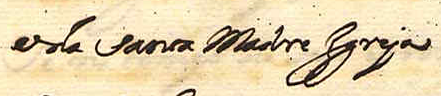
e da Santa Madre Jgreja
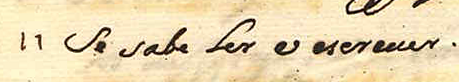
11 Se sabe ler e escreuer.
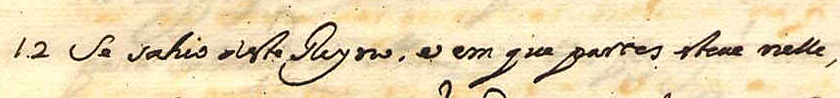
12 Se sahio deste Reyno, e em que partes esteue nelle,
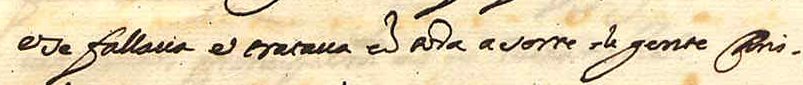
e se fallaua e trataua cō toda a sorte de gente Chris
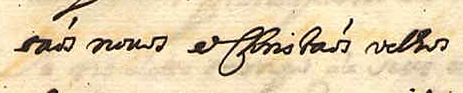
taõs nouos e Christaõs velhos.
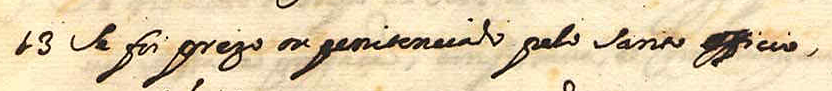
13 Se foi prezo ou penitenciado pelo santo officio,
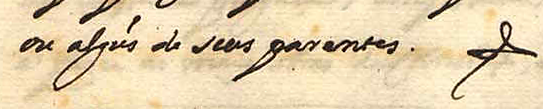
ou algūs de seus parentes.
